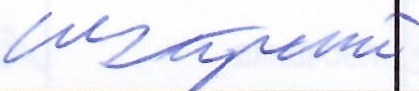сигарсий
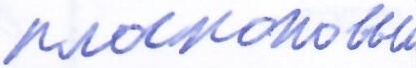плосконовы
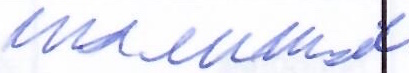скалистя
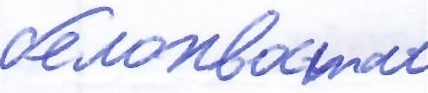белохвостая
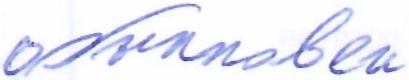обыкновен
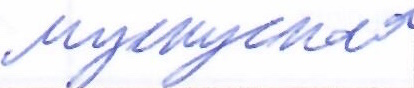мускусная
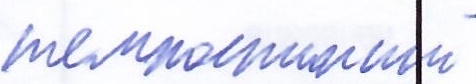темноспинный
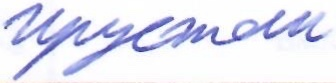хрустан
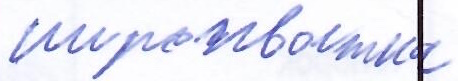широхвостка
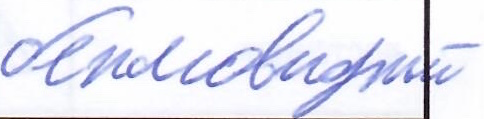бекасовидный
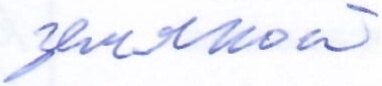земяной
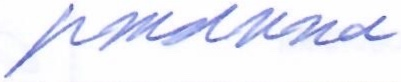ржанка
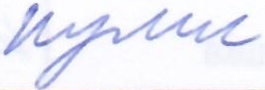кулиг
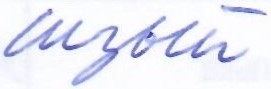сизый
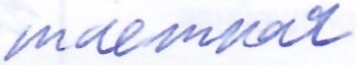таежная
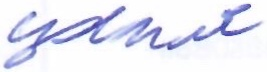цапля
